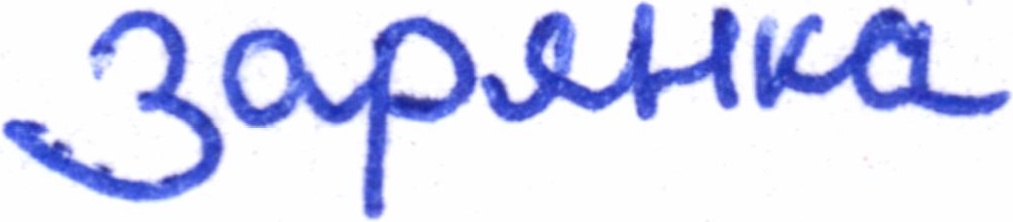зарянка
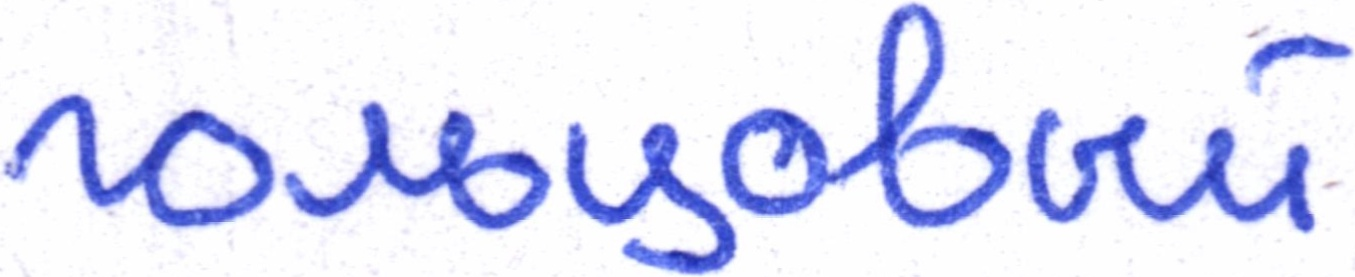гольцовый
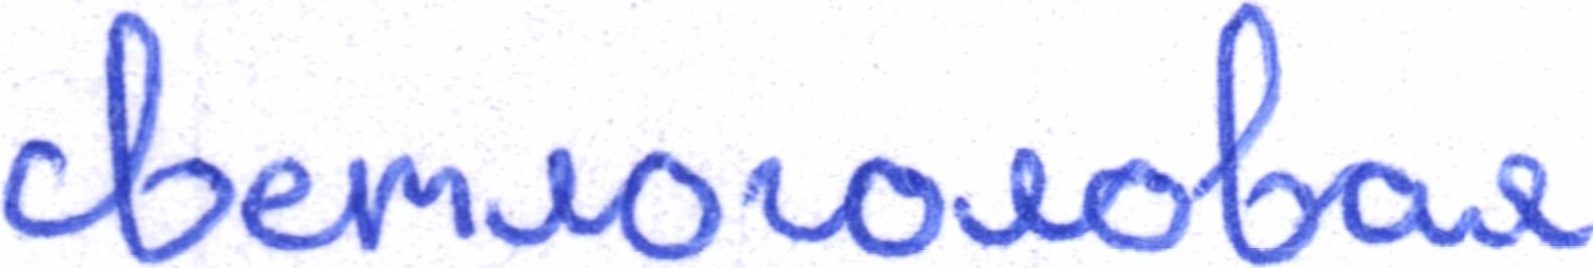светлоголовая
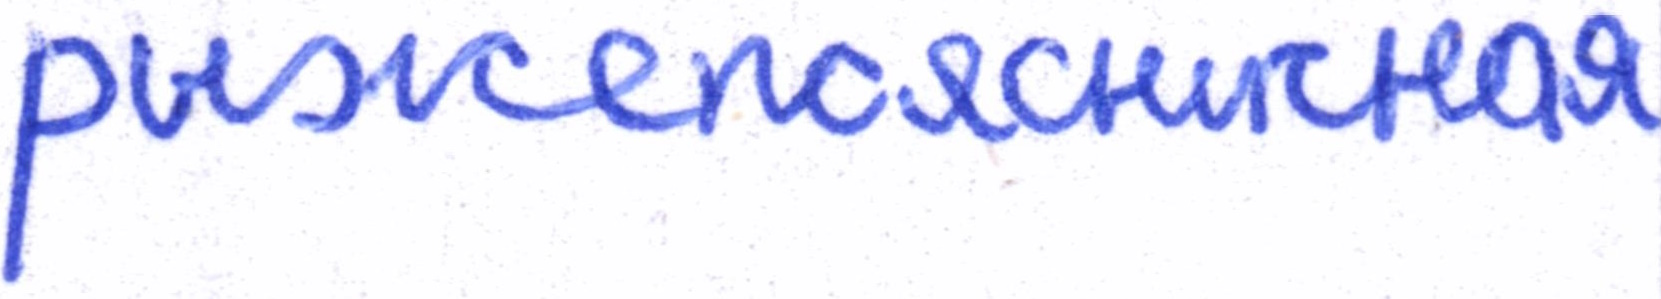рыжепоясничная
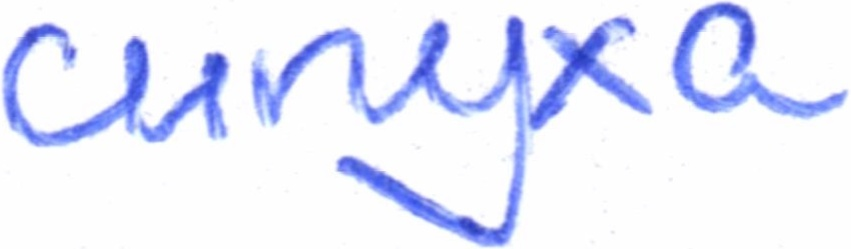сипуха
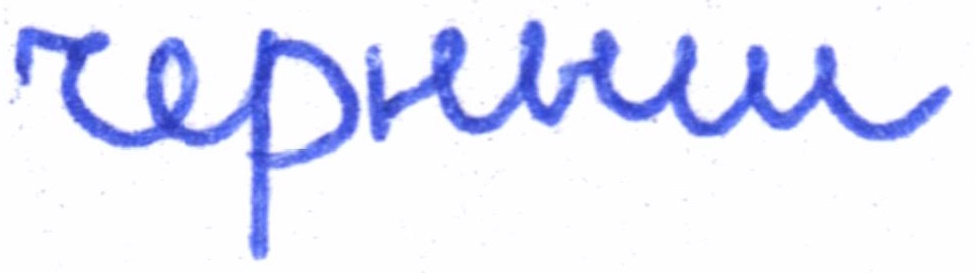черныш
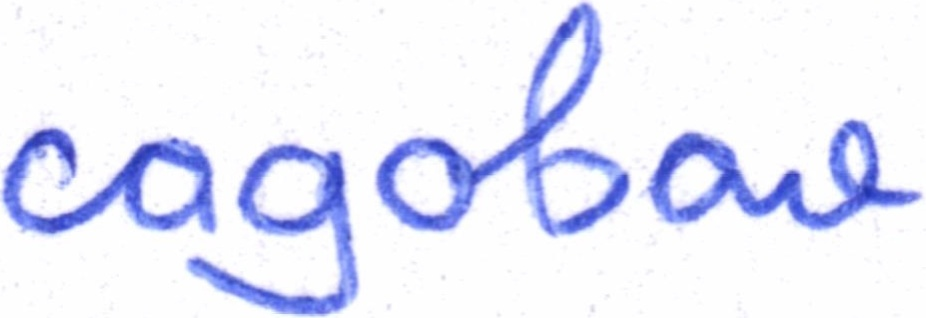садовая
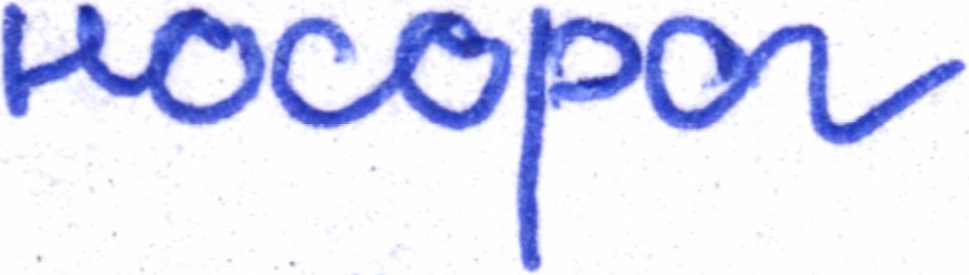носорог
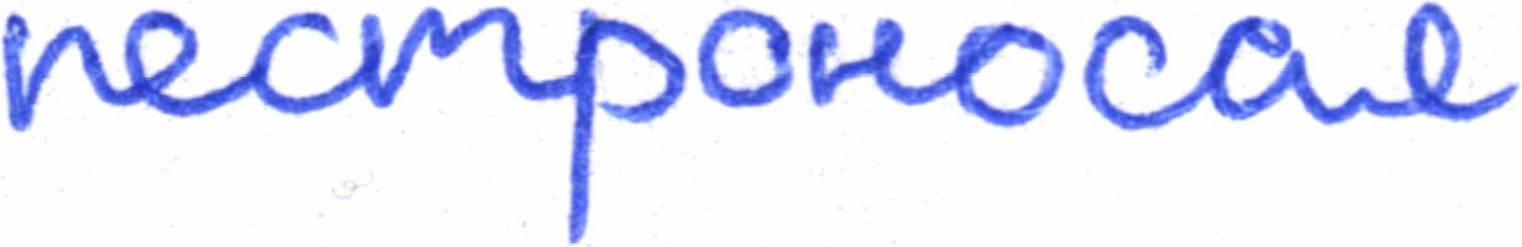пестроносая
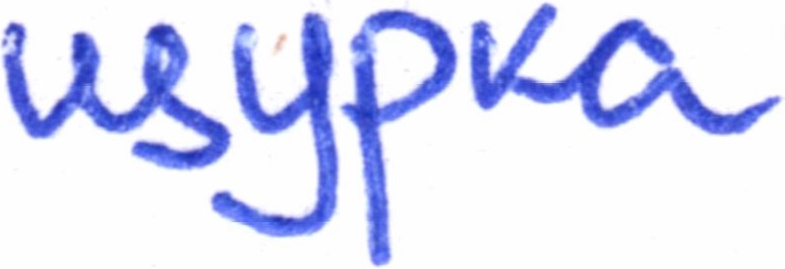щурка
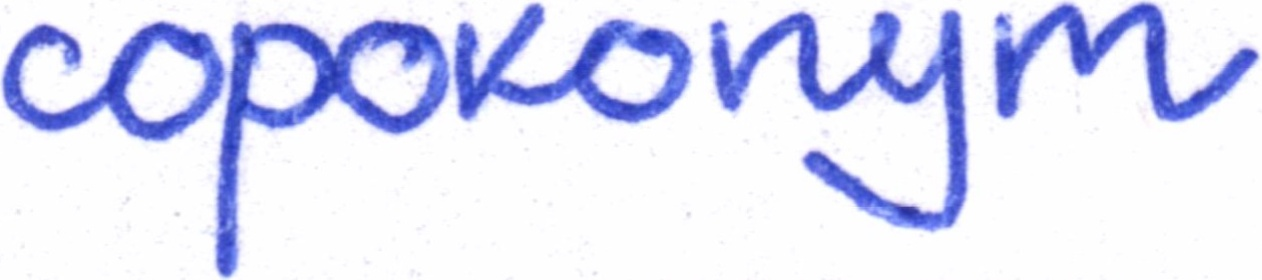сорокопут
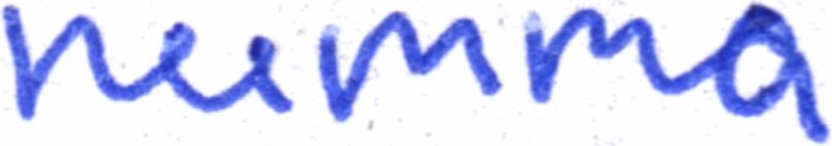питта
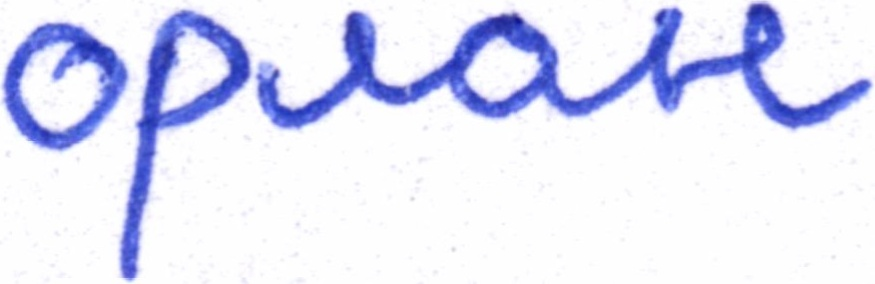орлан
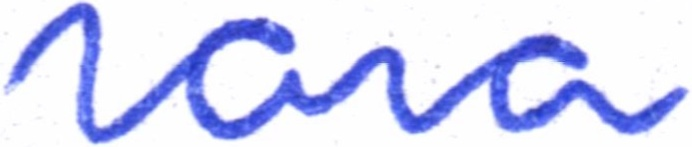гага
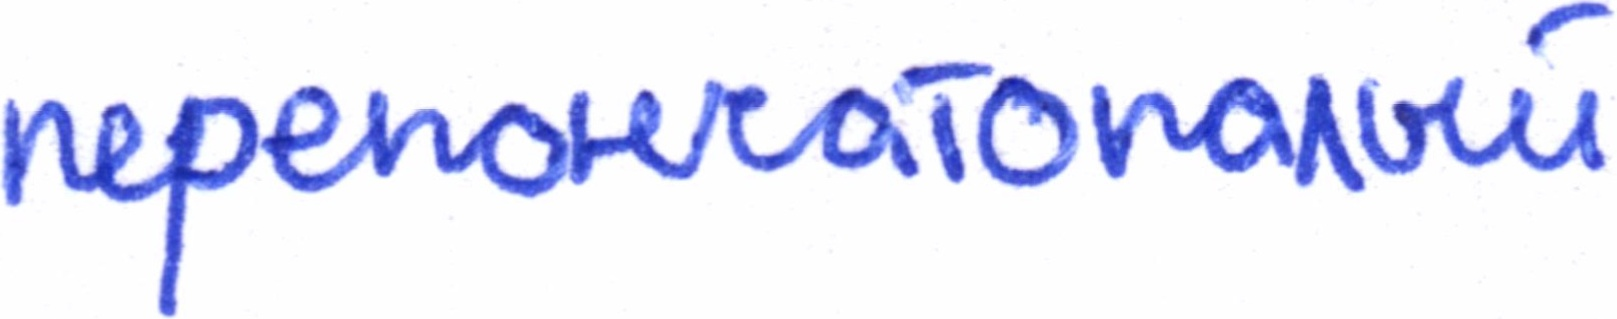перепончатопалый
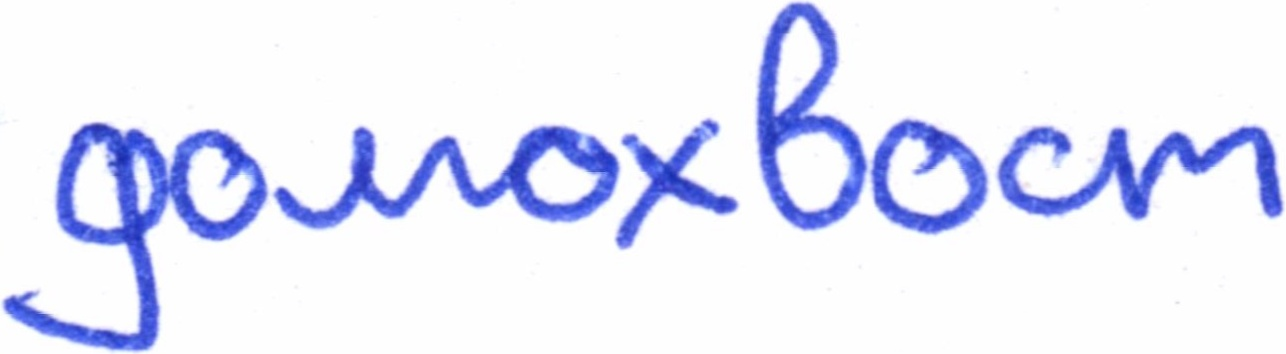долгохвост
